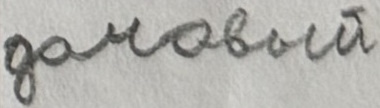домовый
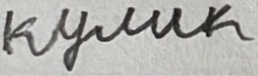кулик
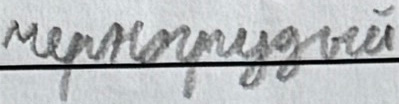черногрудый
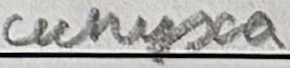сипуха
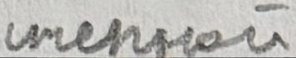степной
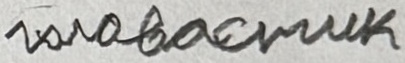головастик
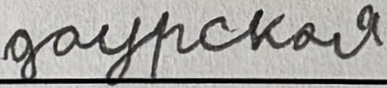даурская
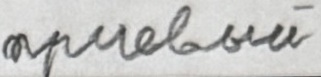арчевый
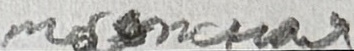тбожная
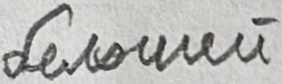белошей
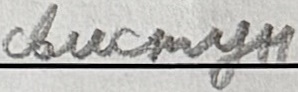свистун
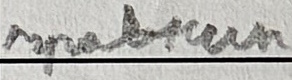травнип
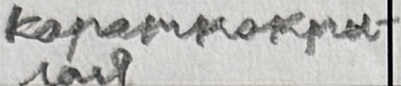короткокры-лая
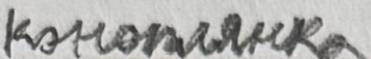коноплянка
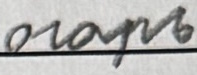огарь
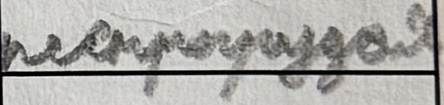пестрогрудая
